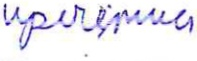кречётка
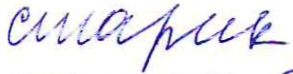старик
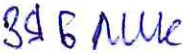зяблик
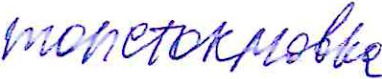толстоклювка
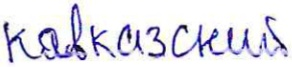кавказский
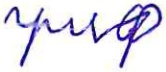гриф
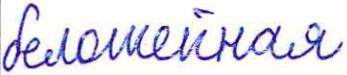белошейная
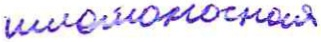шломоносная
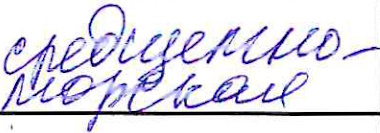средиземно-морская
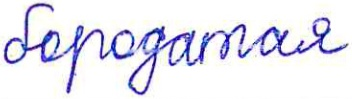бородатая
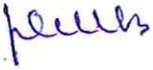ремез
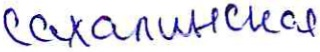сахалинская
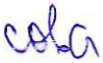сова
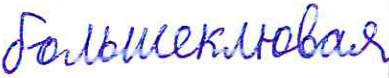большеклювая
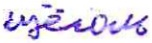щёголь
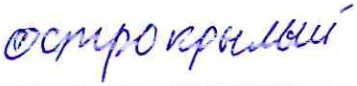острокрылый
